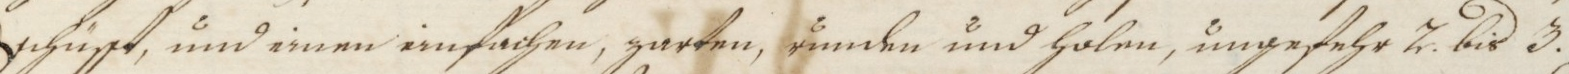schüsst, und einen einfachen, zarten, runden und holen, ungefehr 2. bis 3.
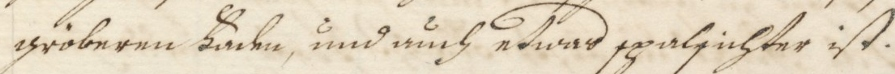gröberen Faden, und auch etwas spalsichter ist.
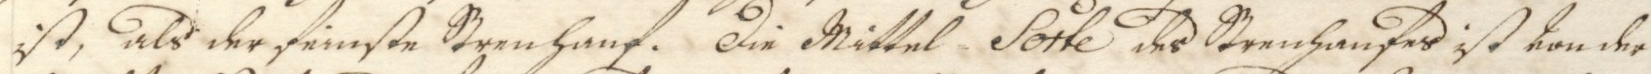ist, als der feinste Strenhanf. Die Mittel Sorte des Strenhanfes ist von der
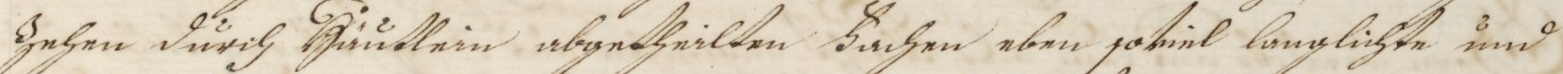Zehen durch Häutlein abgetheilten Fachen eben soviel langlichte und
